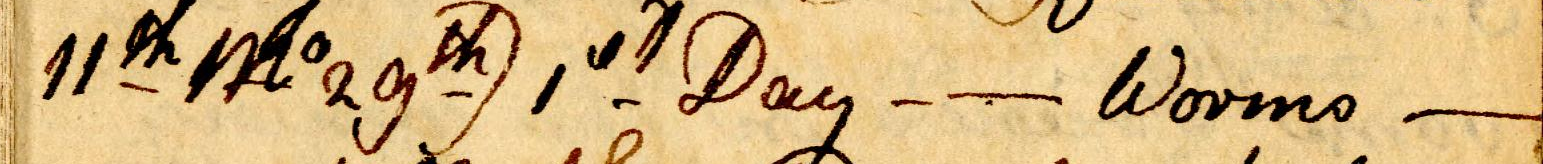11^th M^o 29^th) 1^st Day- Worms-
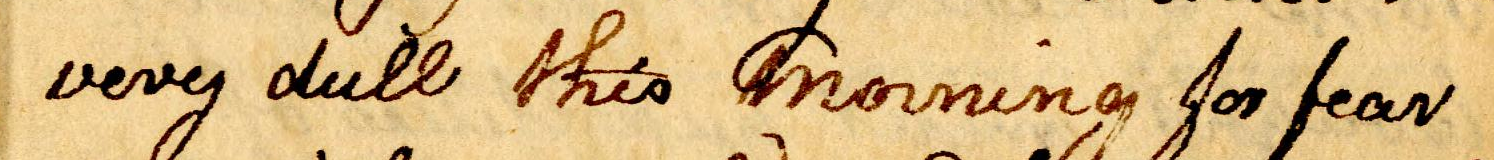very dull this Morning for fear
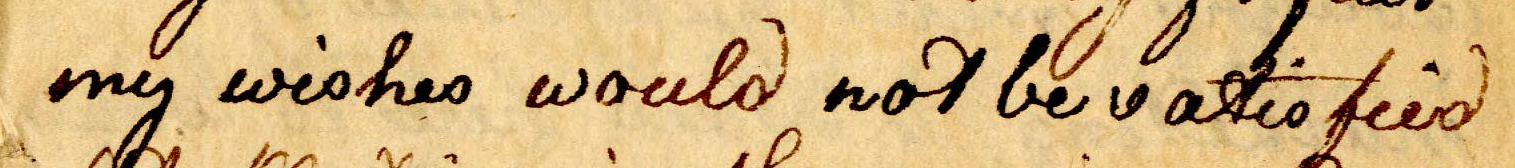my wishes would not be satisfied
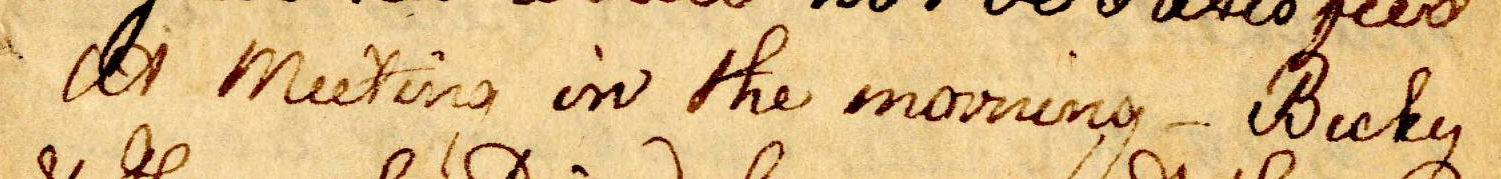At Meeting in the morning- Becky
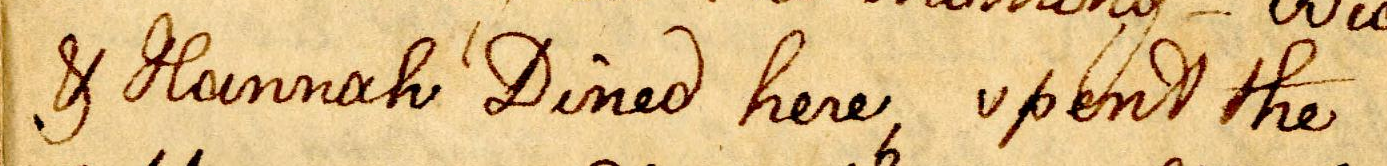& Hannah Dined here, spent the
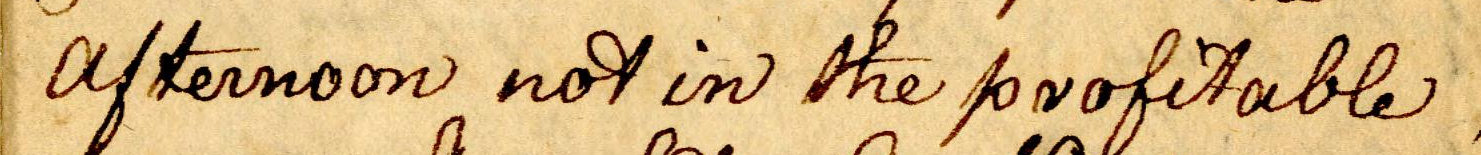Afternoon not in the profitable
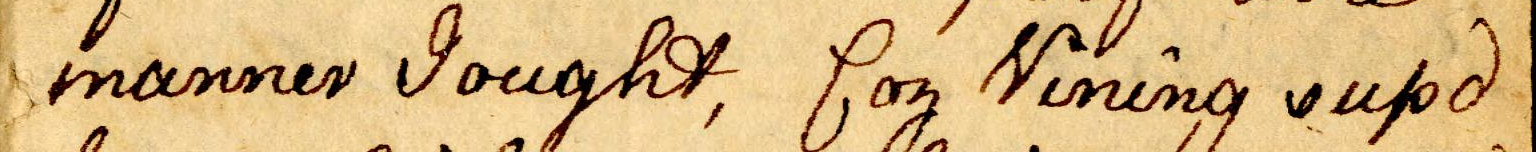manner I ought, Coz Vining supd
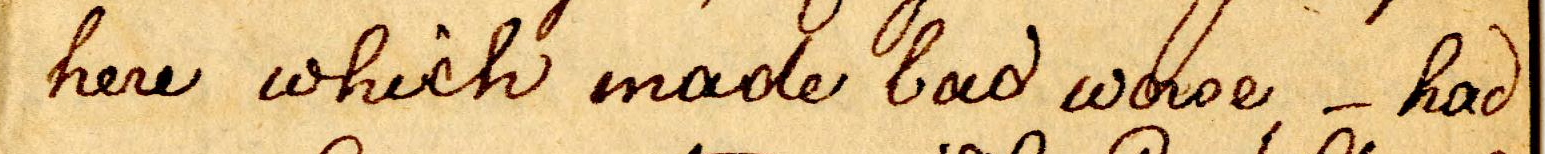here which made bad worse- had
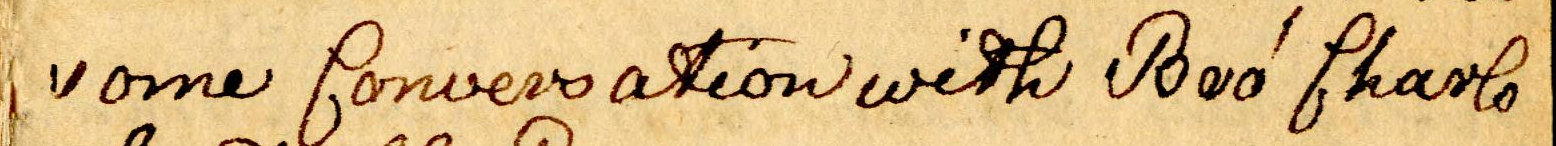some Conversation with Bro' Charls
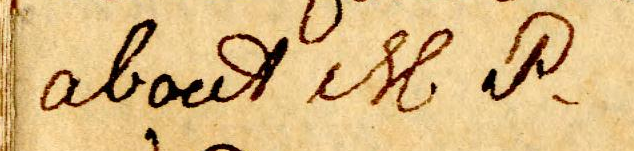about M P.
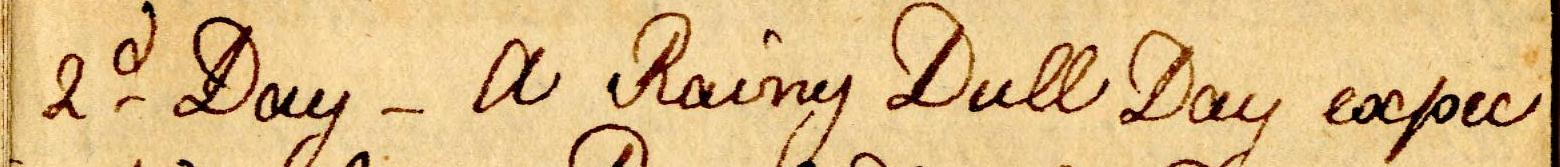2^d Day- A Rainy Dull Day expec
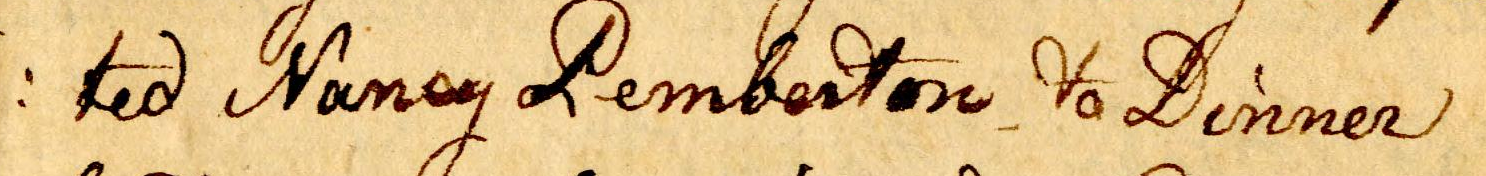-ted Nancy Pemberton to Dinner
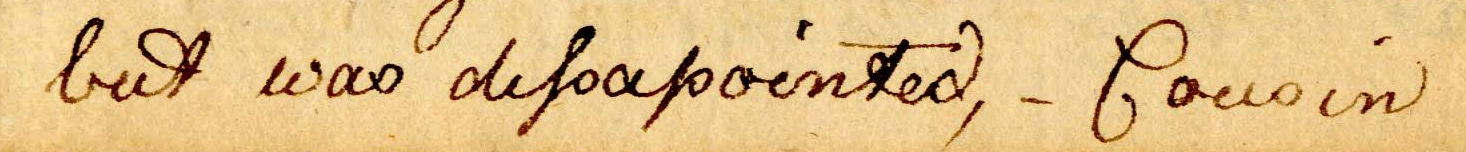but was dissapointed,- Cousin
